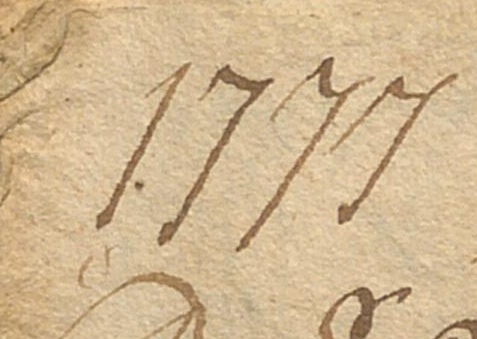1777
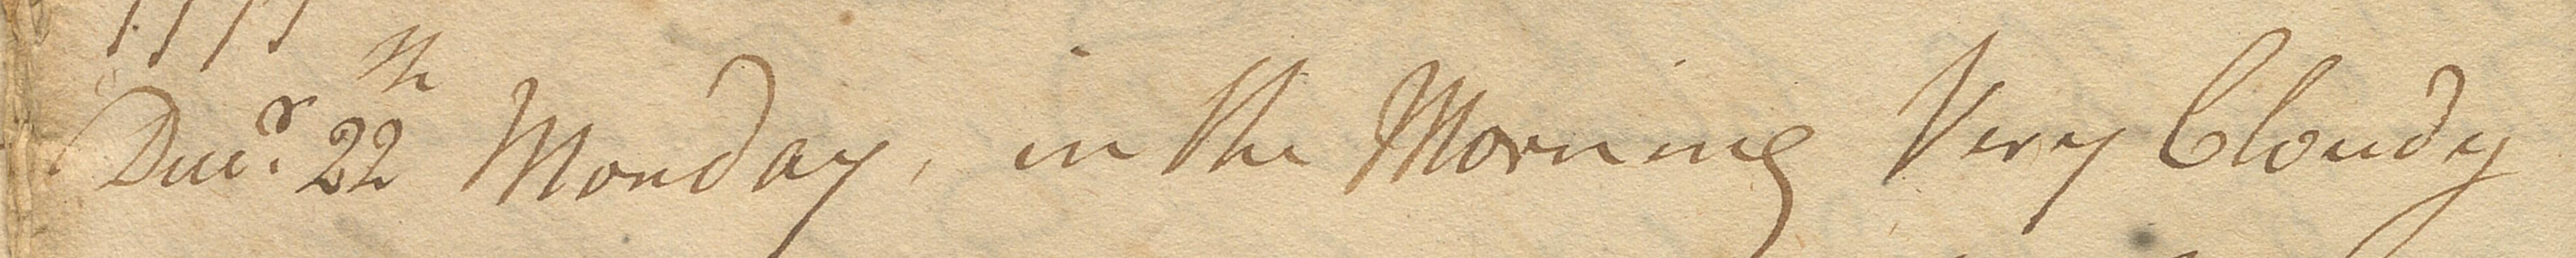Dece^r. 22^th Monday, in the Morning Very Cloudy
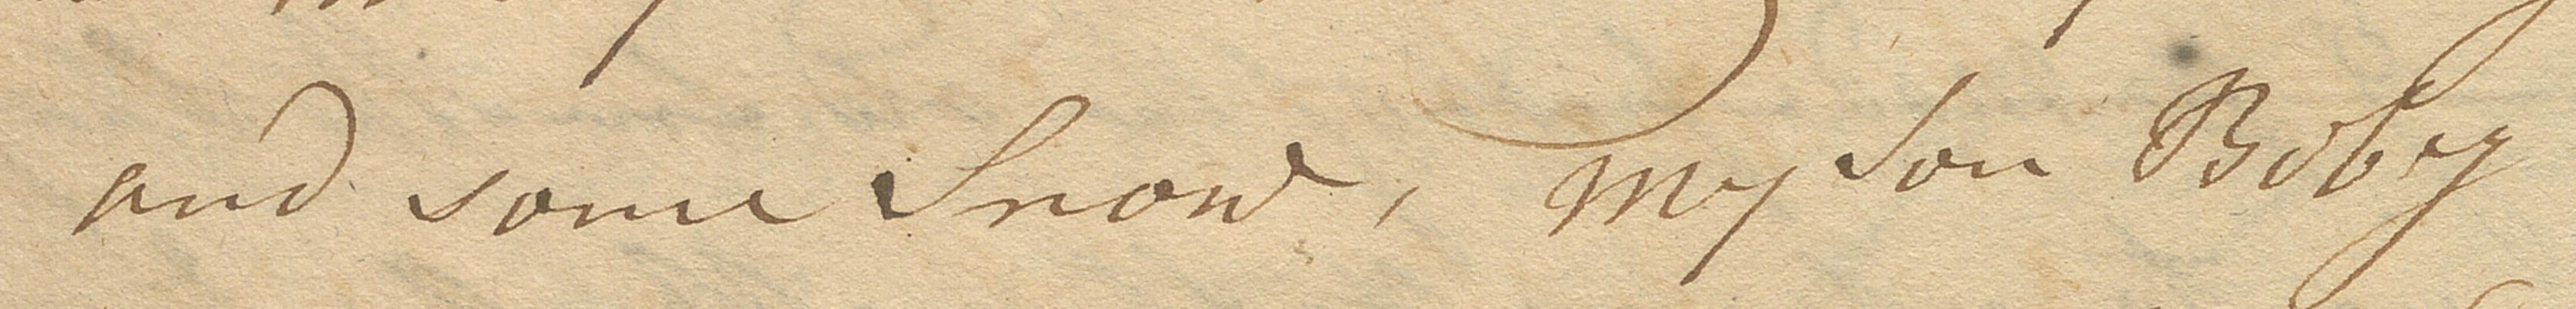and some snow, My son Bobey
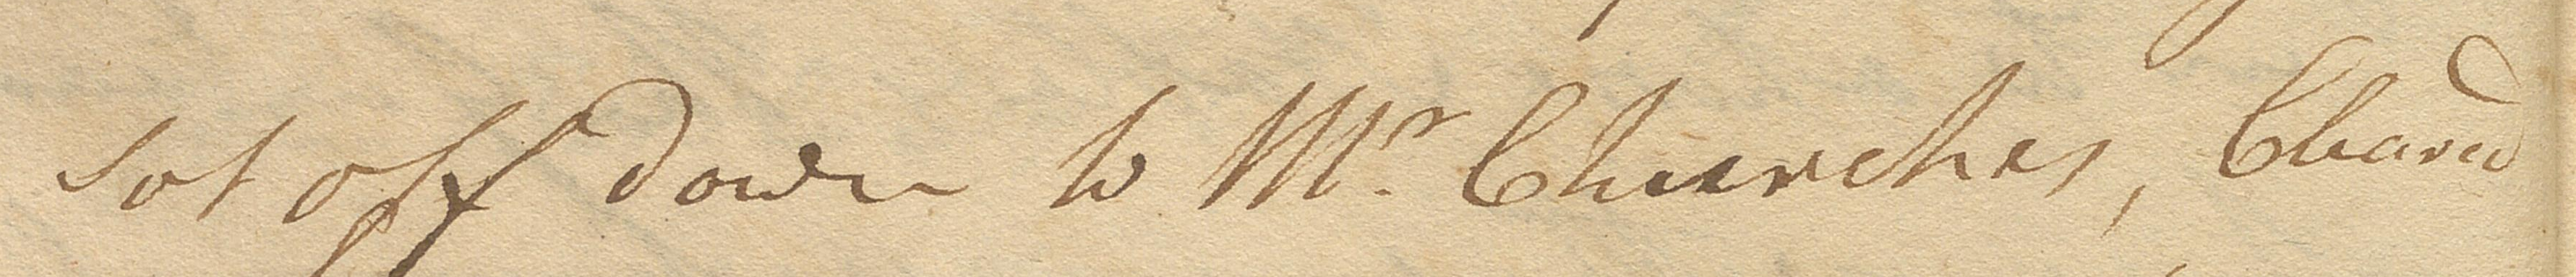set off down to M^r. Churches, Cleared
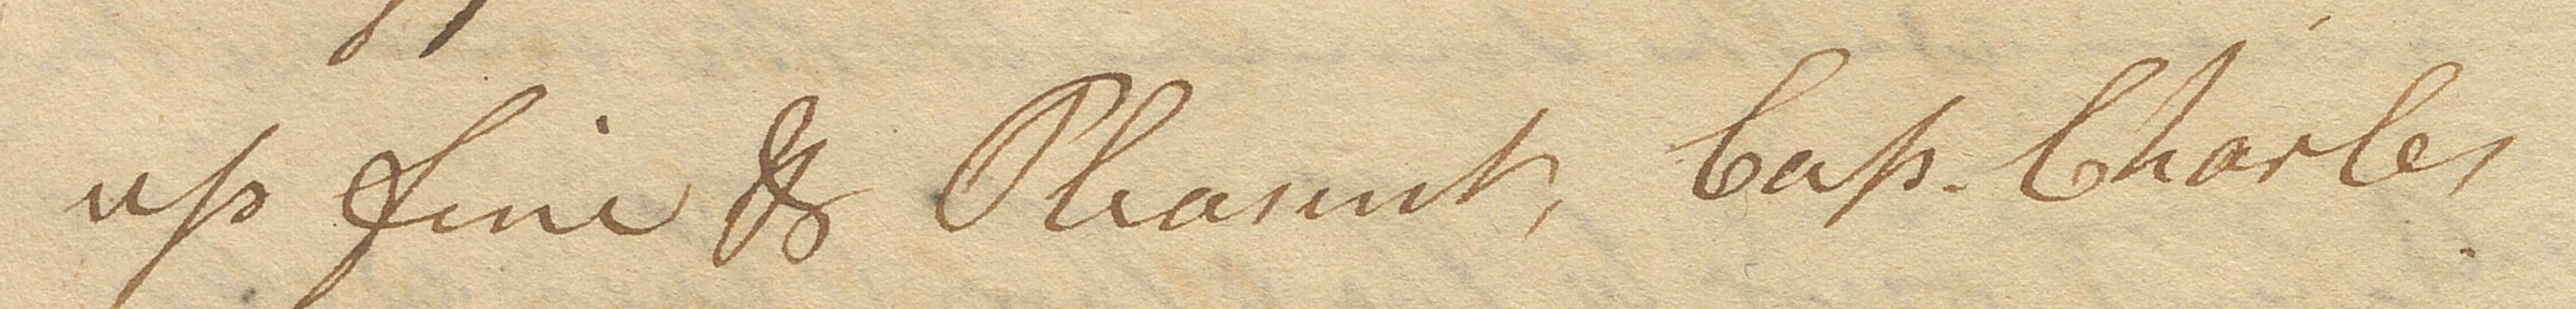up fine & Pleasent, Cap. Charles
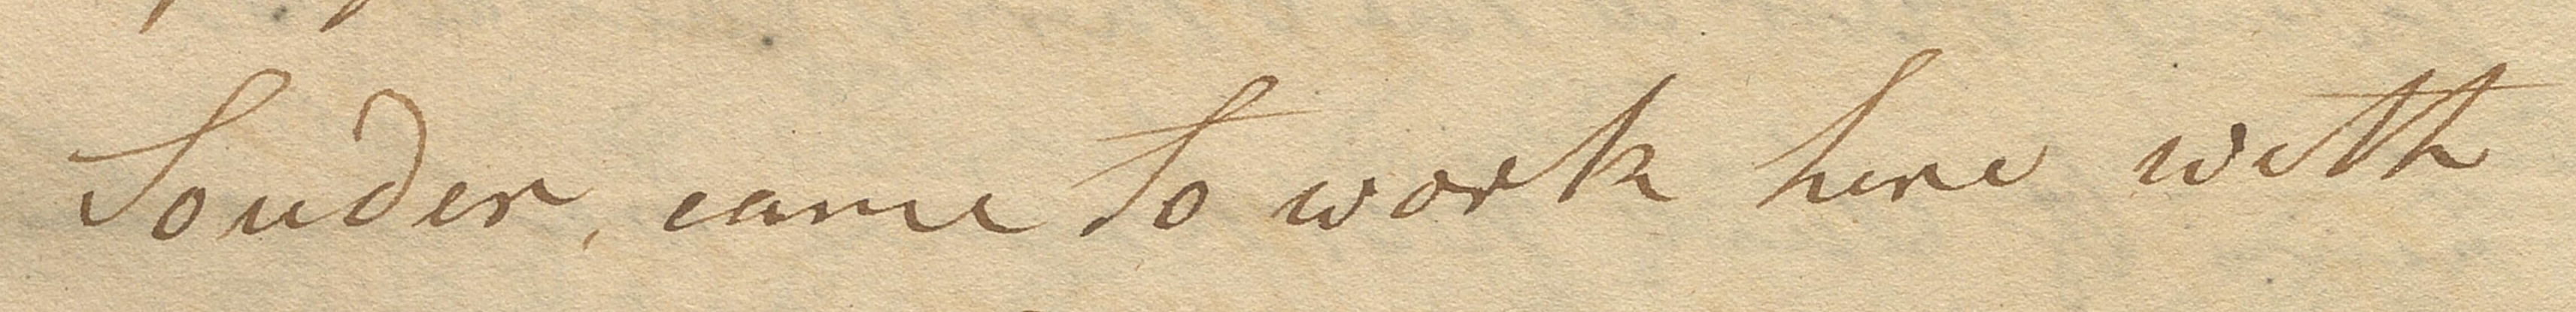Souder, came to work here with
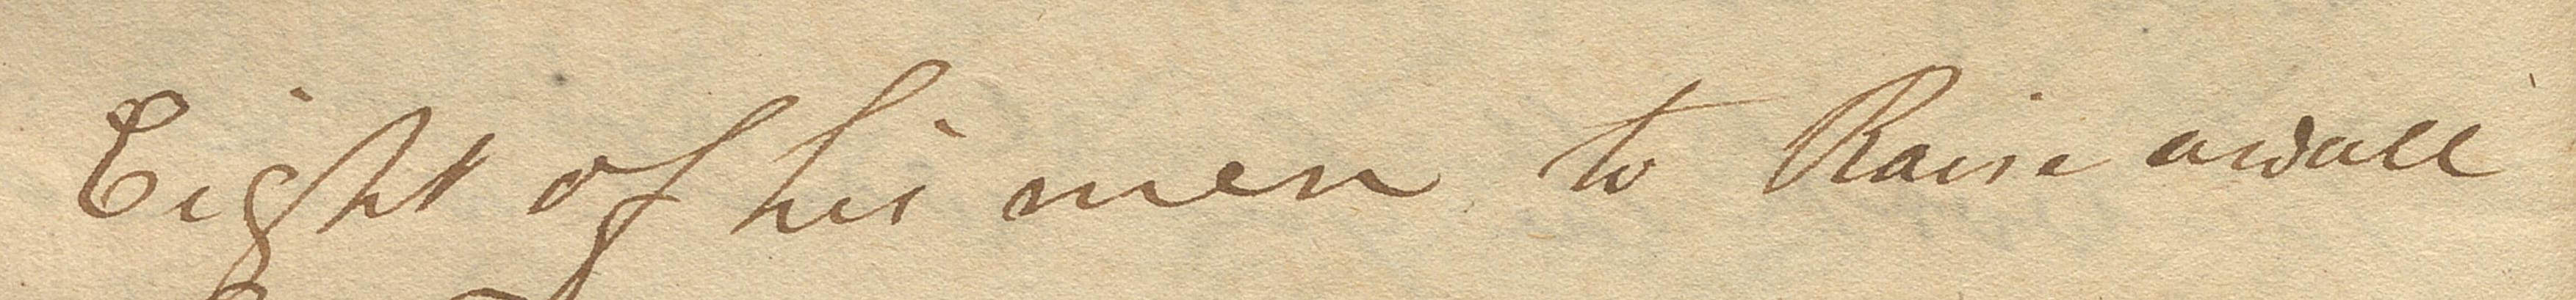Eight of his men to Raise a wall
